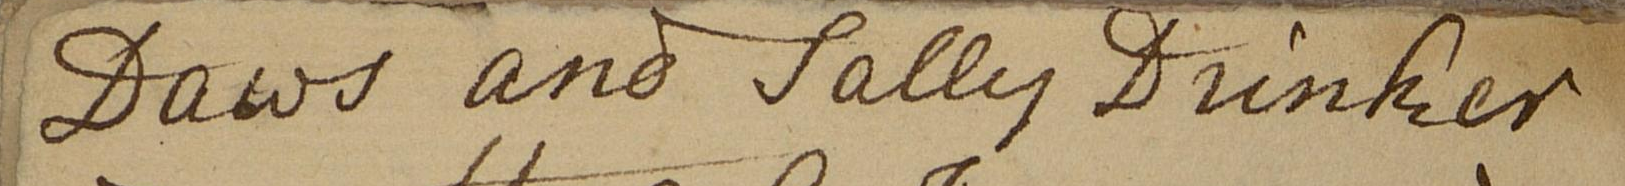Daws and Sally Drinker
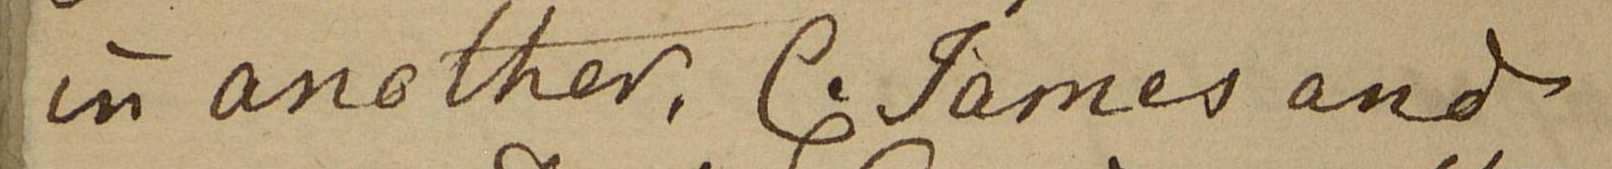in another, C. James and
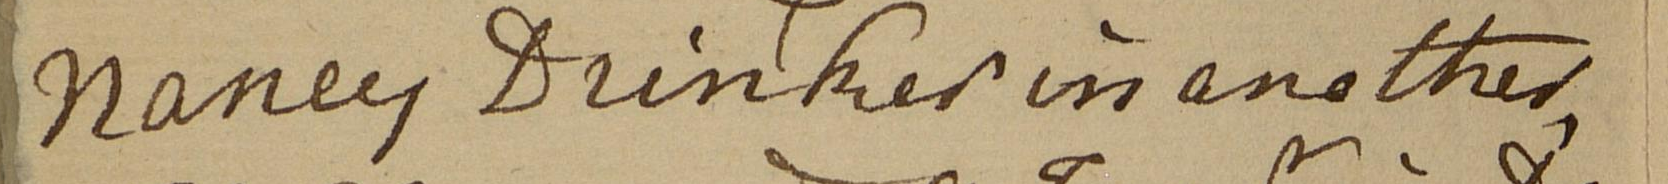Nancy Drinker in another
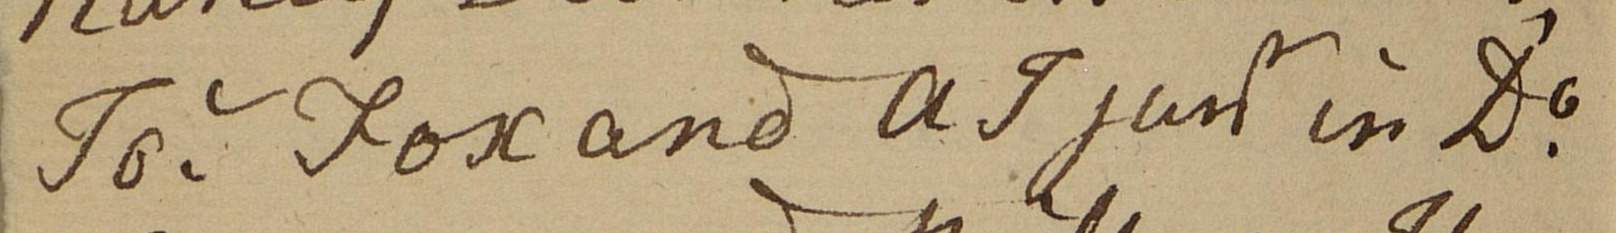To^c. Fox and AJ jun^r in D^o.
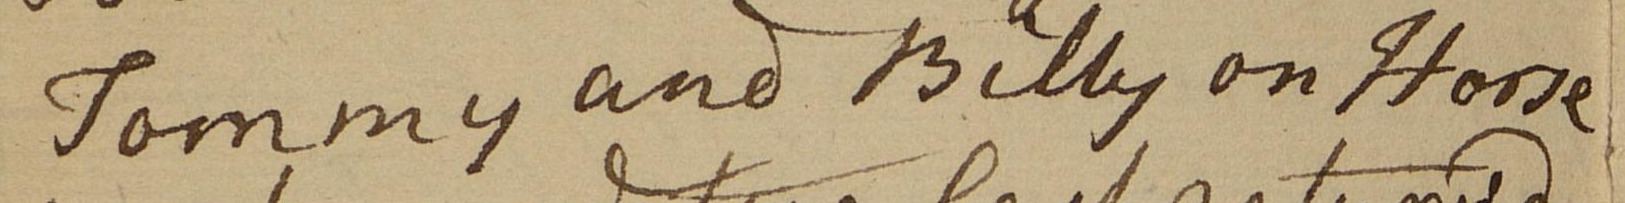Tommy and Billy on Horse
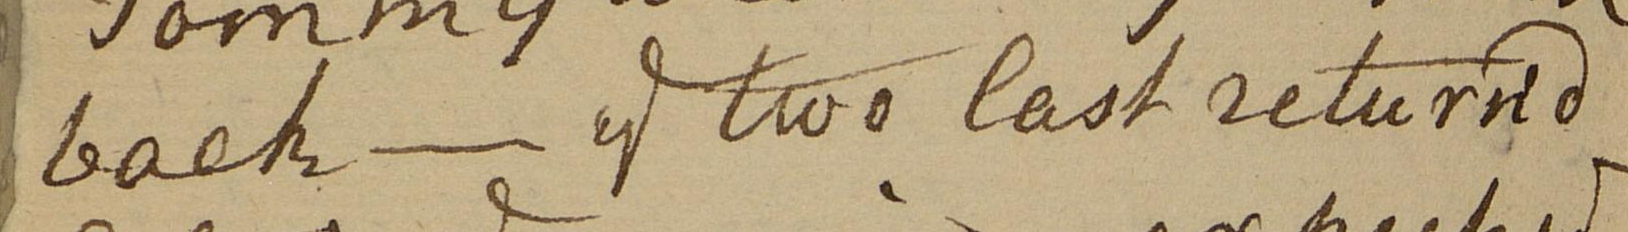back- y^e two last return'd
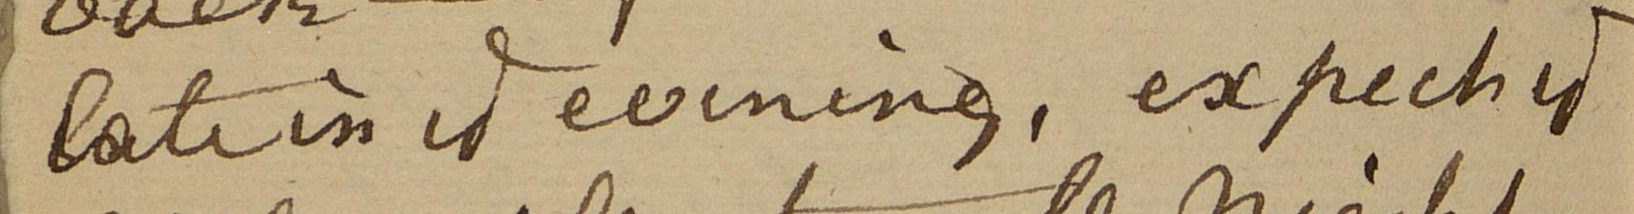late in y^e evening, expect y^e
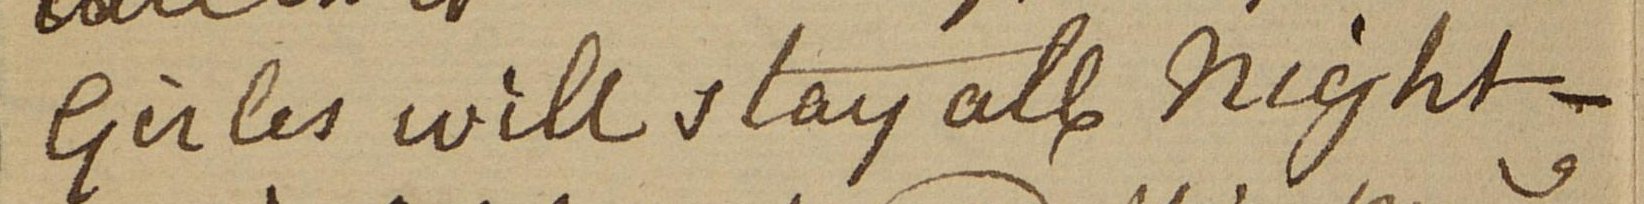Girles will stay all night-
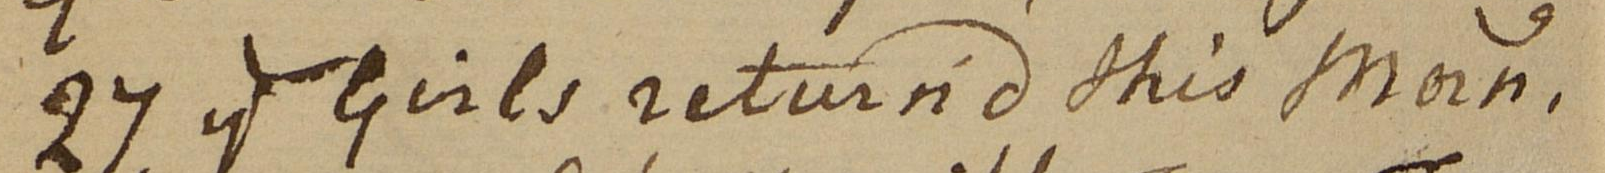27 y^e Girls return'd this Morn^g.,
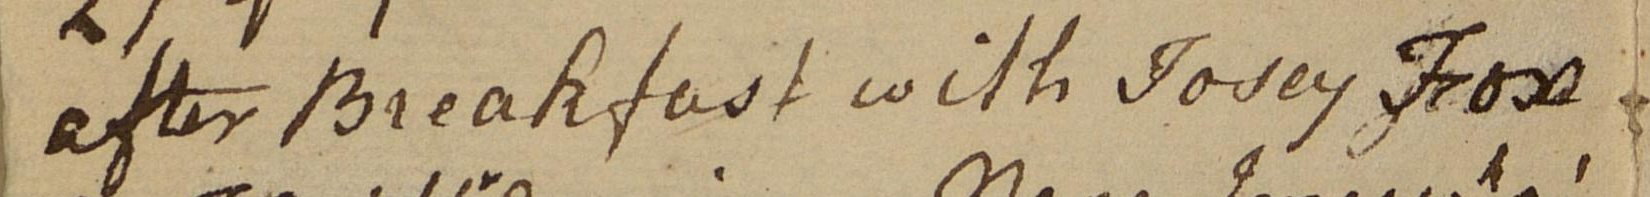after Breakfast with Josey Fox
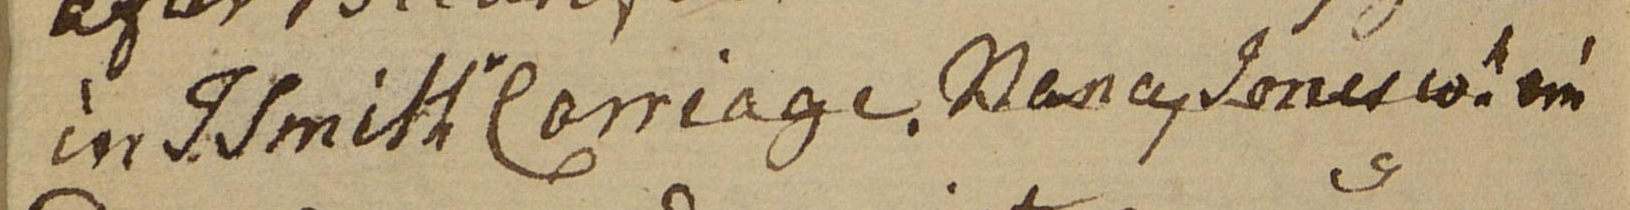in T. Smith Carriage, Nancy Jones w^h [em']
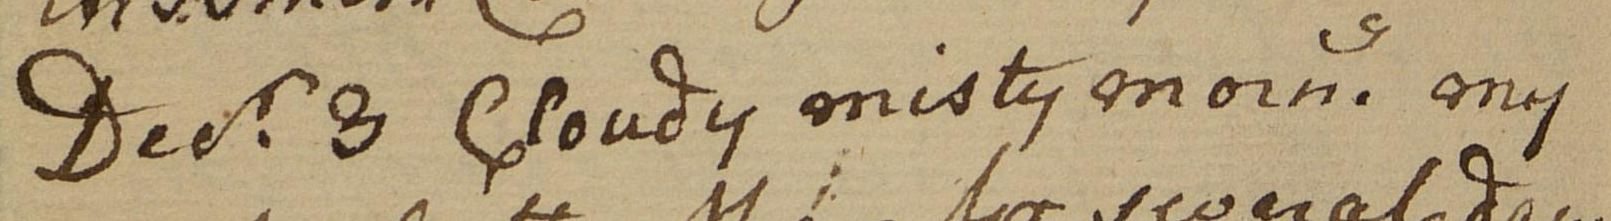Dec^r. 3 Cloudy misty morn^g. my
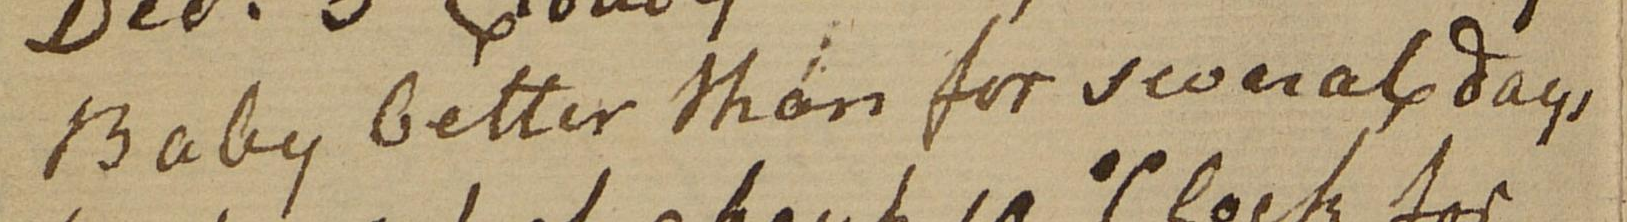Baby better than for several days
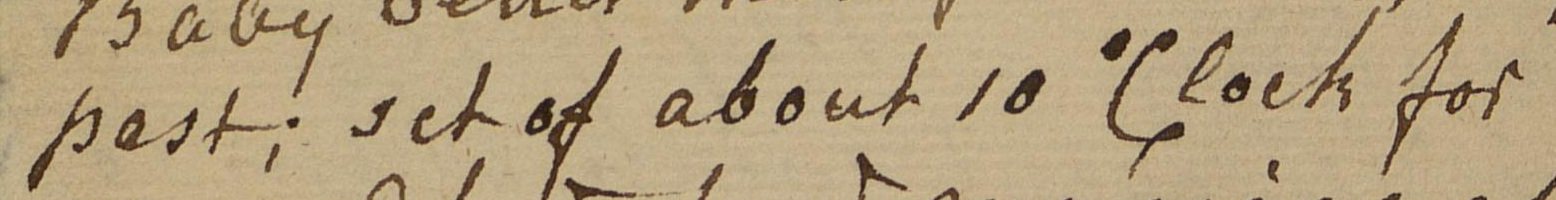past; set of about 10 ^o Clock for
